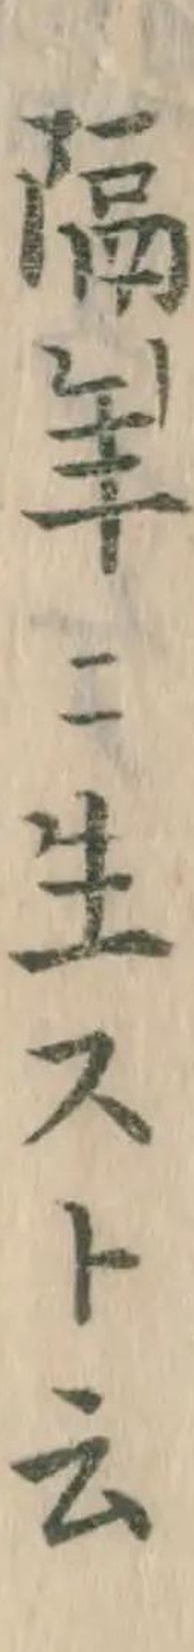隔年ニ生スト云

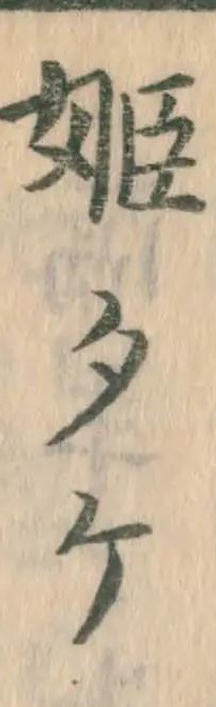姫タケ
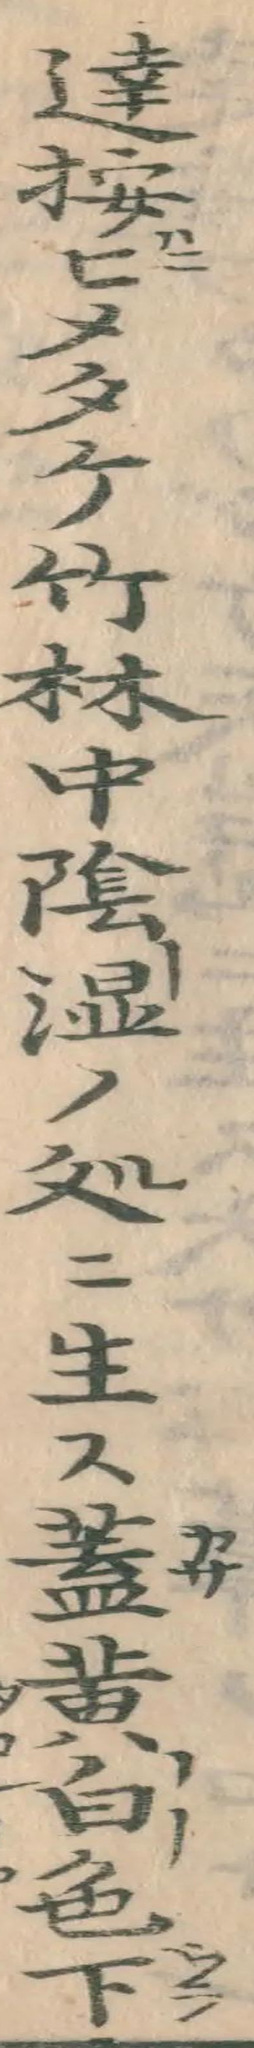達按姫タケ竹林中陰湿ノ処ニ生ス葢黄白色下
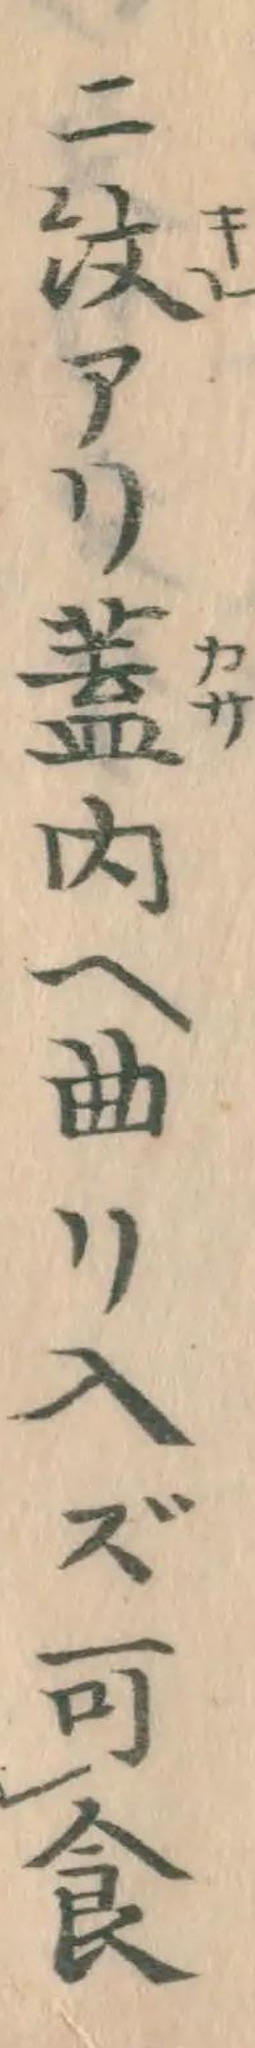ニ紋アリ葢内ヘ曲リ入ズ可食
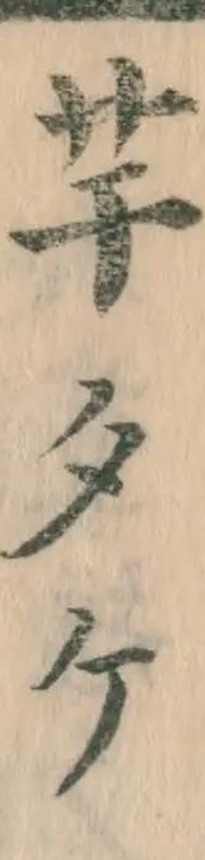芋タケ
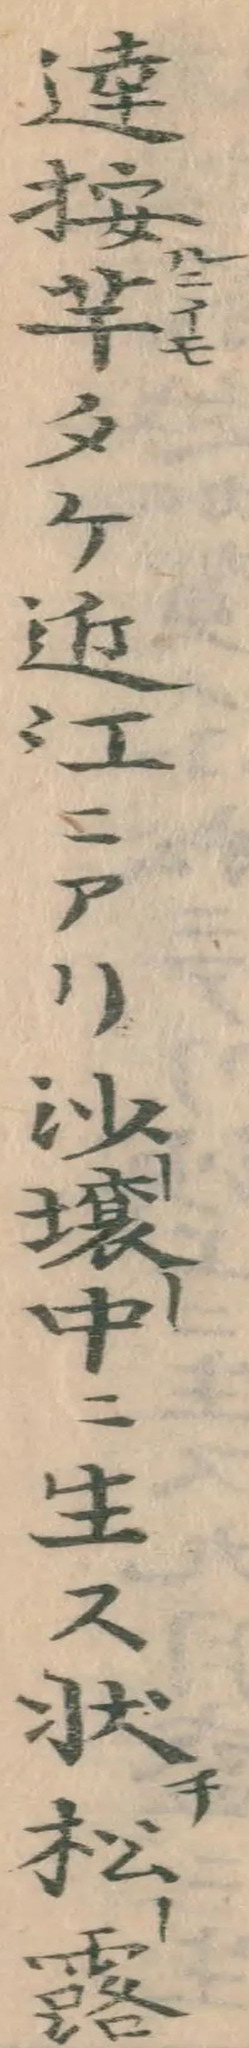達按芋タケ近江ニアリ沙壌中ニ生ス状松露
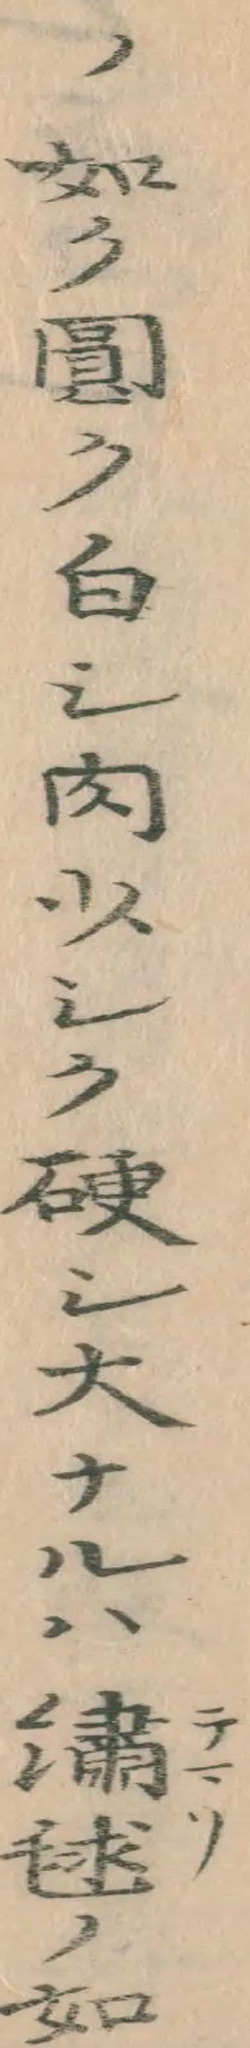ノ如ク円ク白シ肉少シク硬シ大ナルハ繍毬ノ如
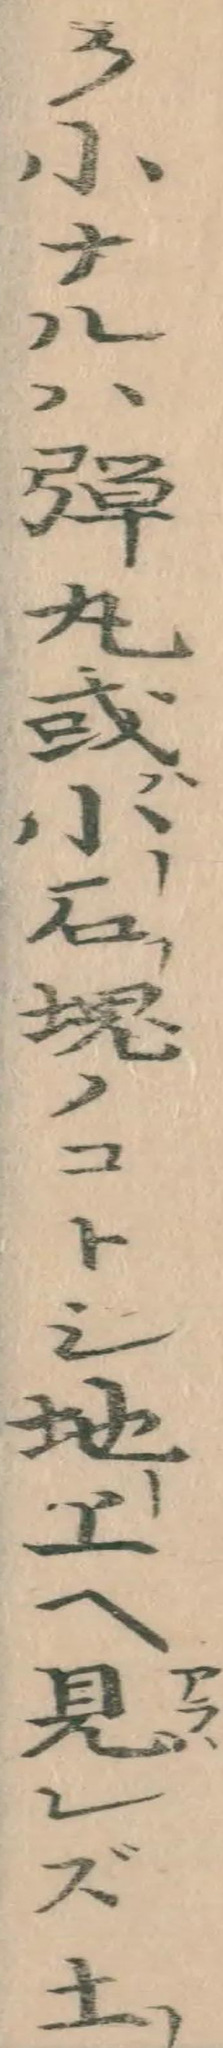ク小ナルハ弾丸或小石塊ノコトシ地上ヘ見レズ土
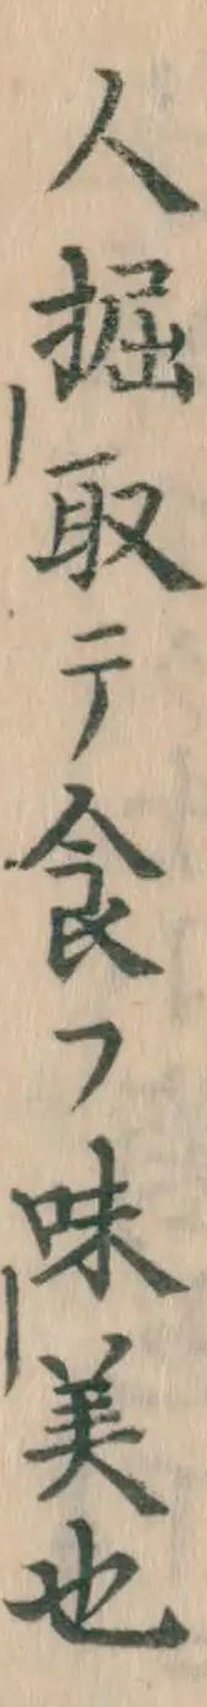人掘取テ食フ味美也
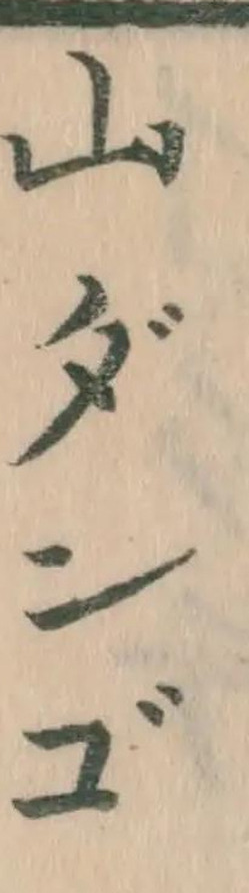山ダンゴ
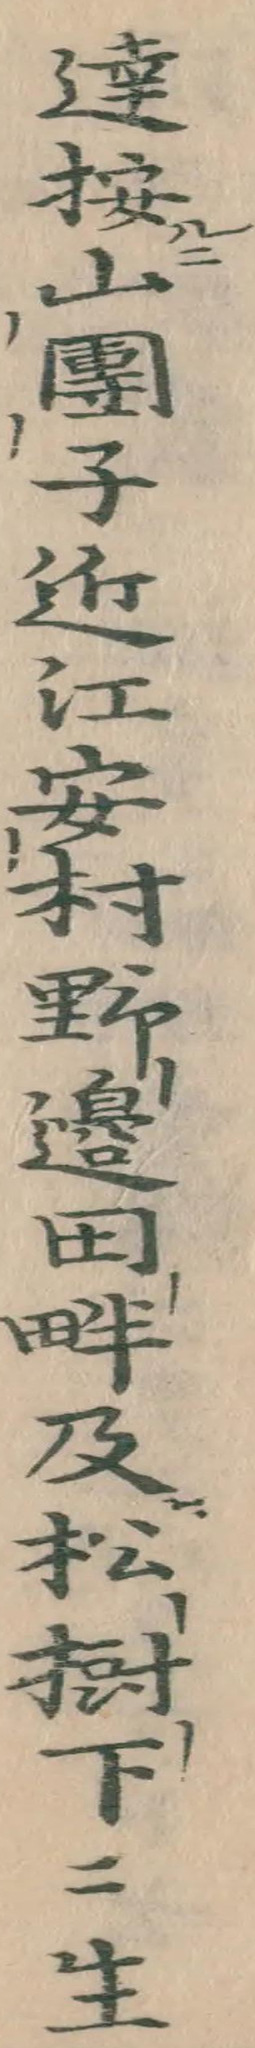達按山団子近江安村野辺田畔及松樹下ニ生
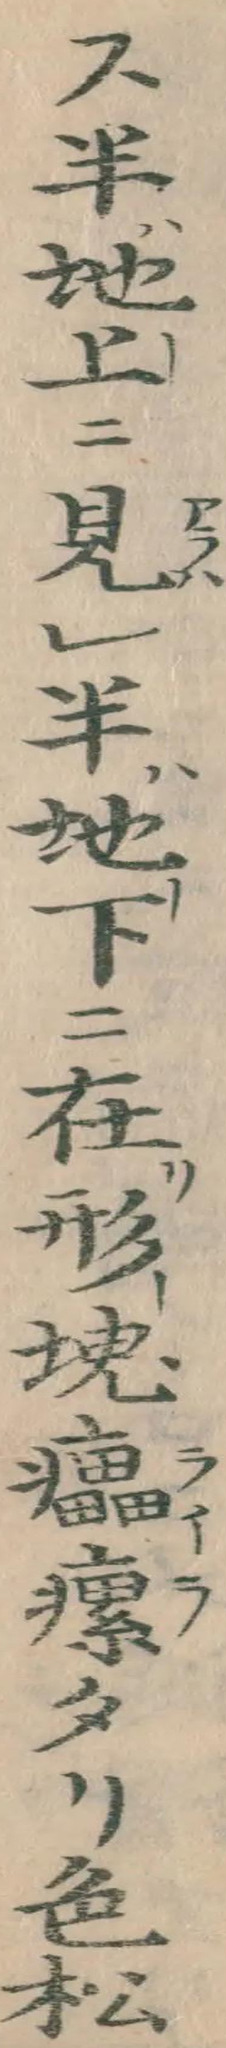ス半地上ニ見レ半地下ニ在形塊㿔瘰タリ色松
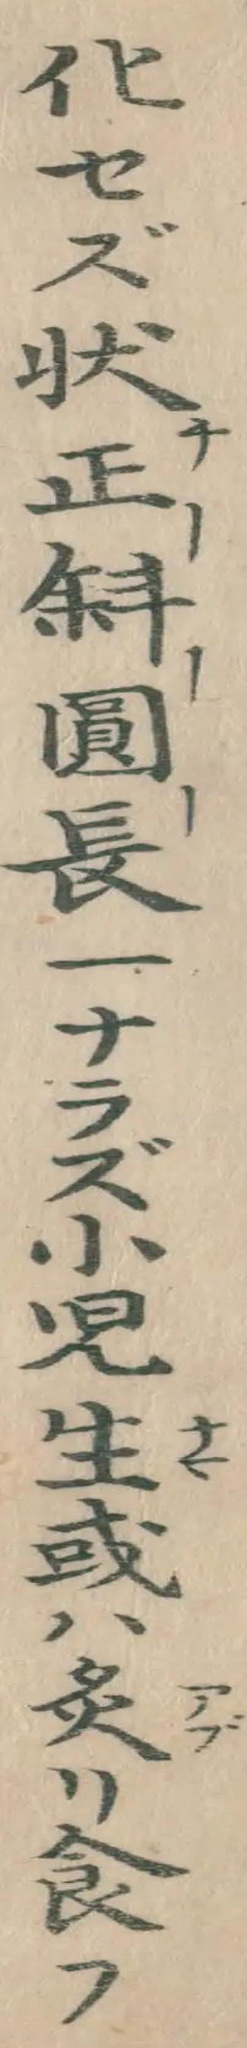化セズ状正斜円長一ナラズ小児生或ハ炙リ食フ
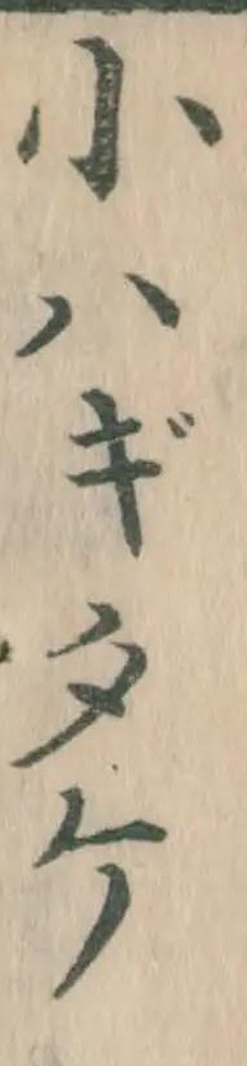小ハギタケ

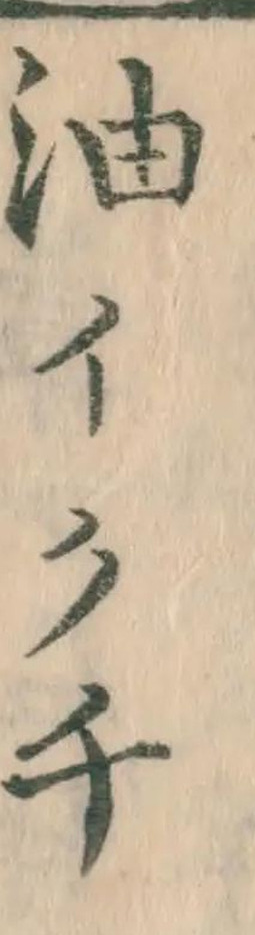油イクチ
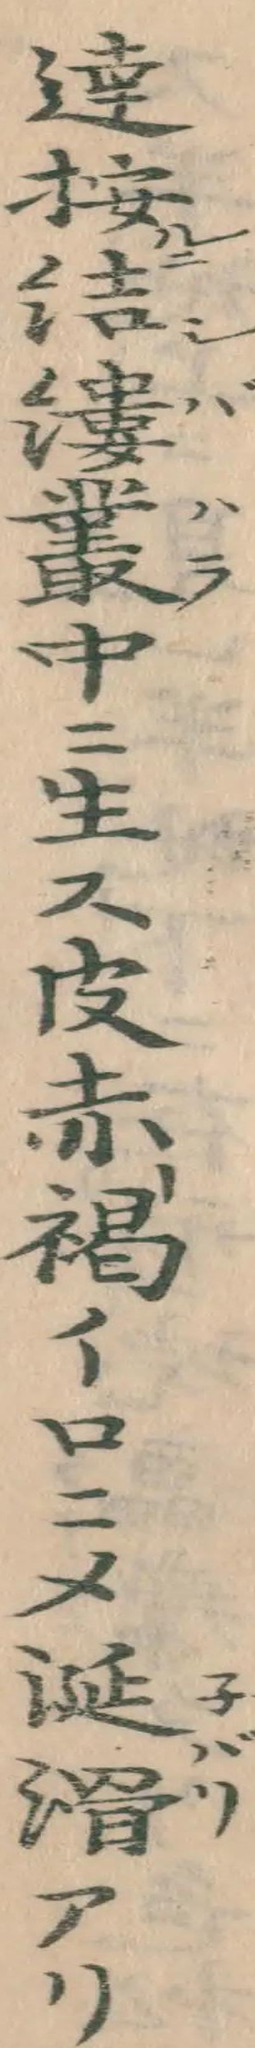達按結縷叢中ニ生ス皮赤褐イロニシテ涎滑アリ
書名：怡顔斎菌品 2巻
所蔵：国立国会図書館 National Diet Library, JAPAN
